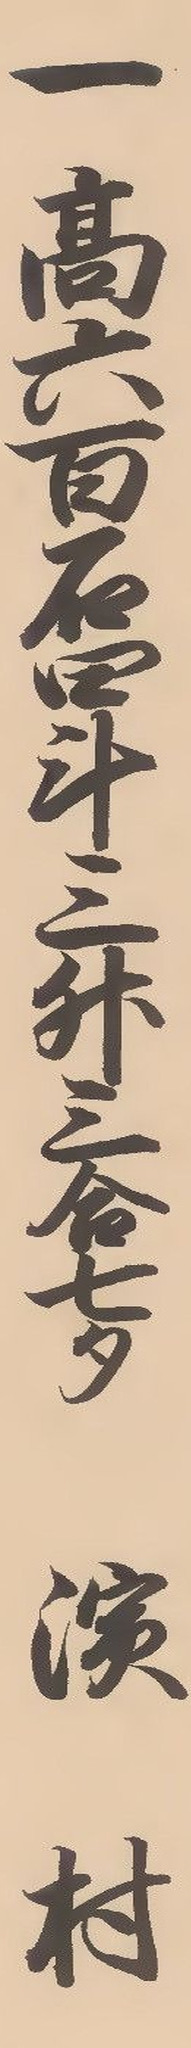一高六百石四斗三升三合七勺浜村
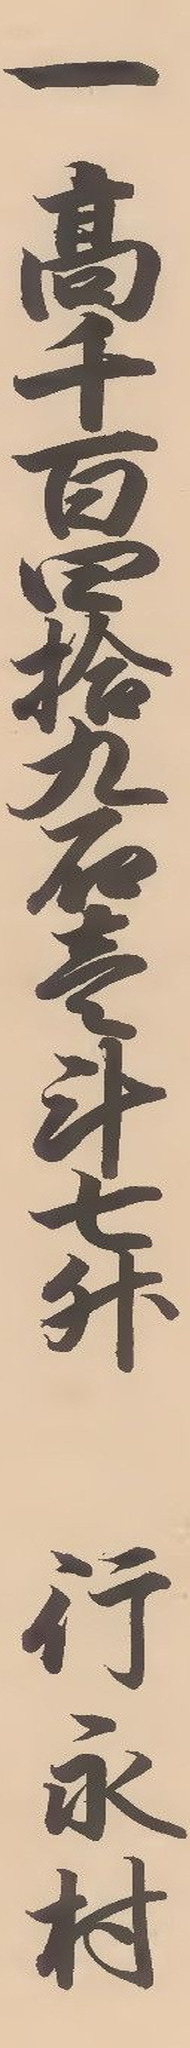一高千百四拾九石壱斗七升行永村
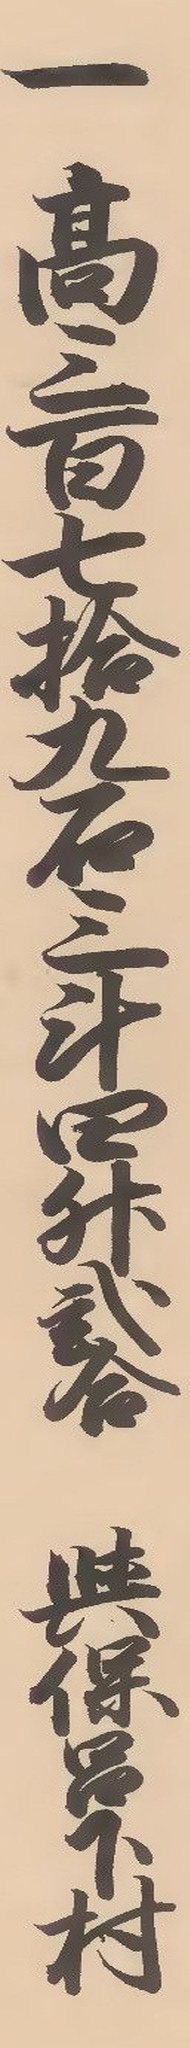一高三百七拾九石三斗四升弐合興保呂下村
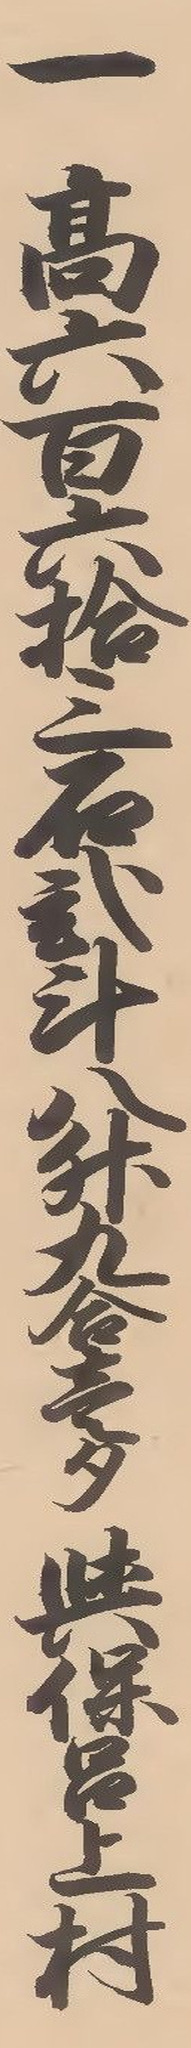一高六百六拾三石弐斗八升九合壱勺興保呂上村
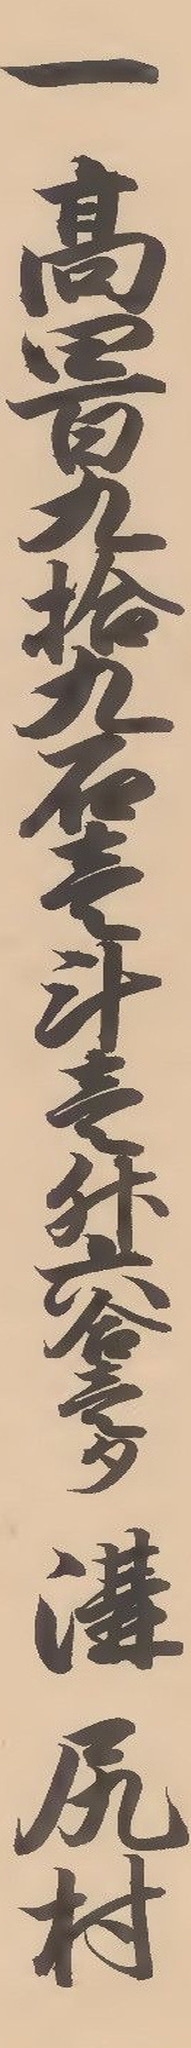一高四百九拾九石壱斗壱升六合壱勺溝尻村
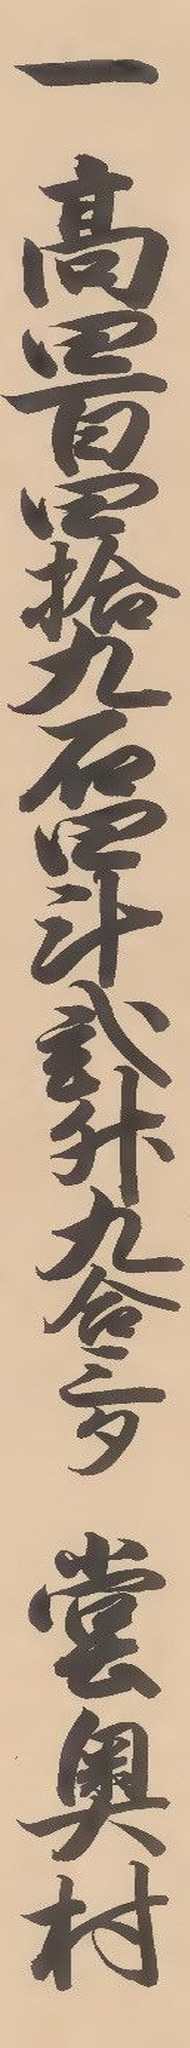一高四百四拾九石四斗弐升九合三勺堂奥村
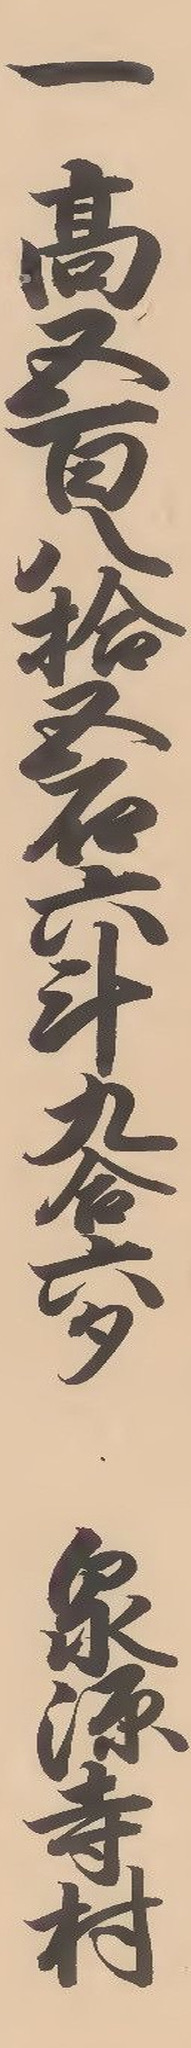一高五百八拾五石六斗九合六勺泉源寺村

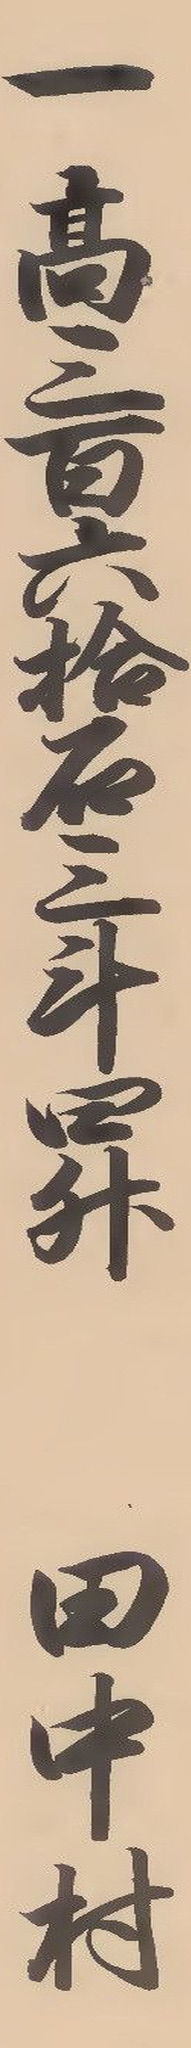一高三百六拾石三斗四升田中村
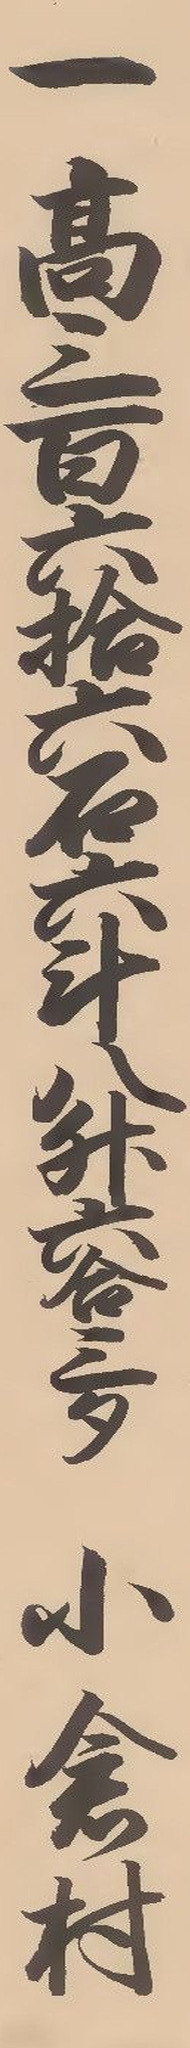一高三百六拾六石六斗八升六合三勺小倉村
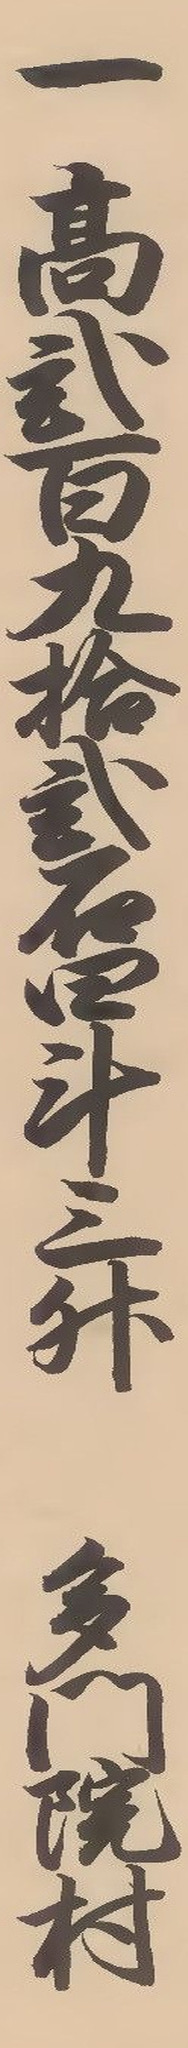一高弐百九拾弐石四斗三升多門院村
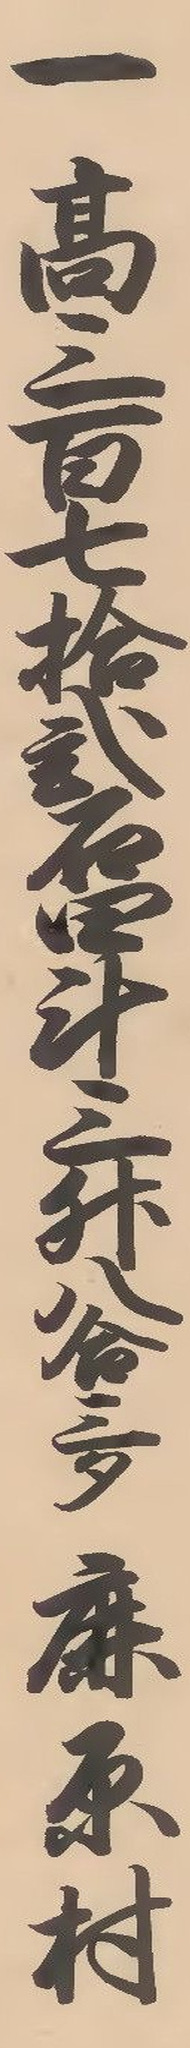一高三百七拾弐石四斗三升八合三勺鹿原村
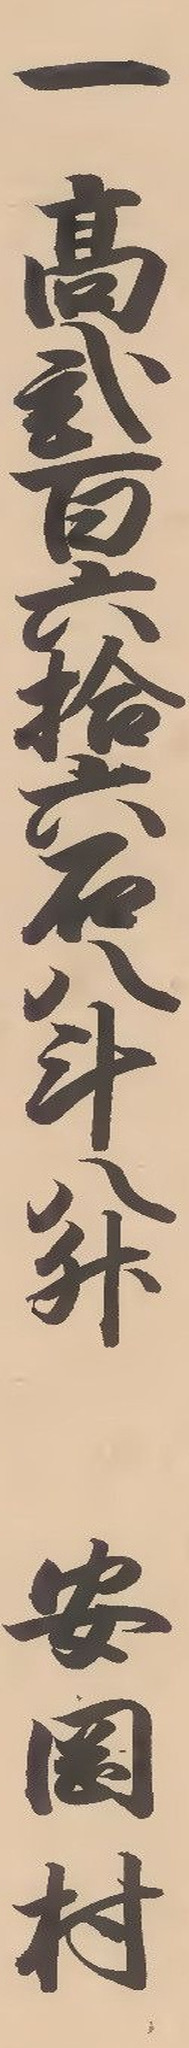一高弐百六拾六石八斗八升安岡村
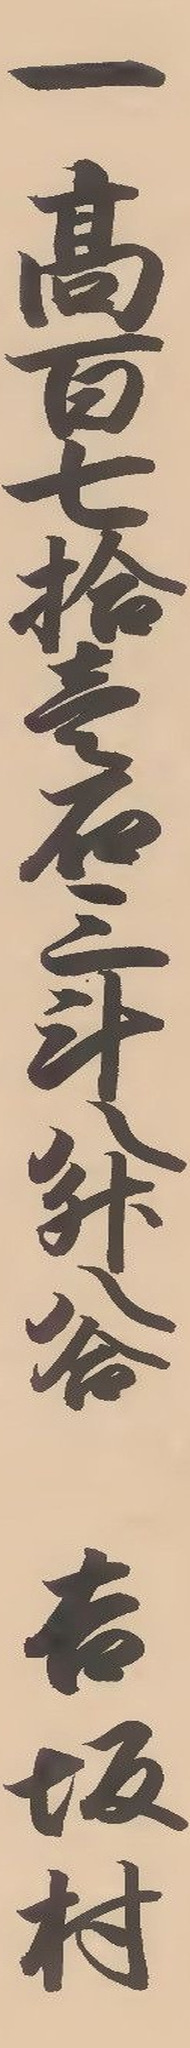一高百七拾壱石三斗八升八合吉坂村
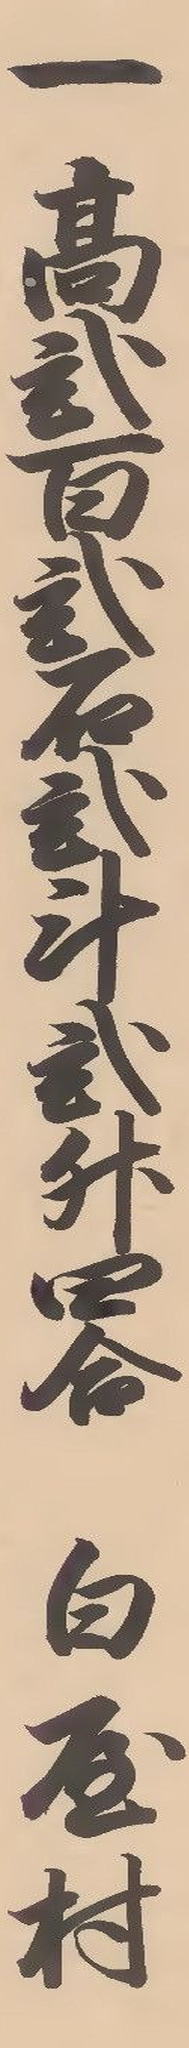一高弐百弐石弐斗弐升四合白屋村

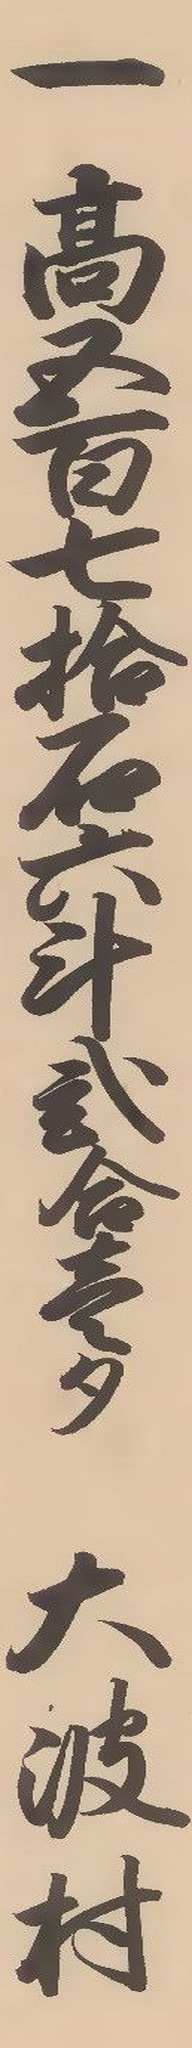一高五百七拾石六斗弐合壱勺大波村
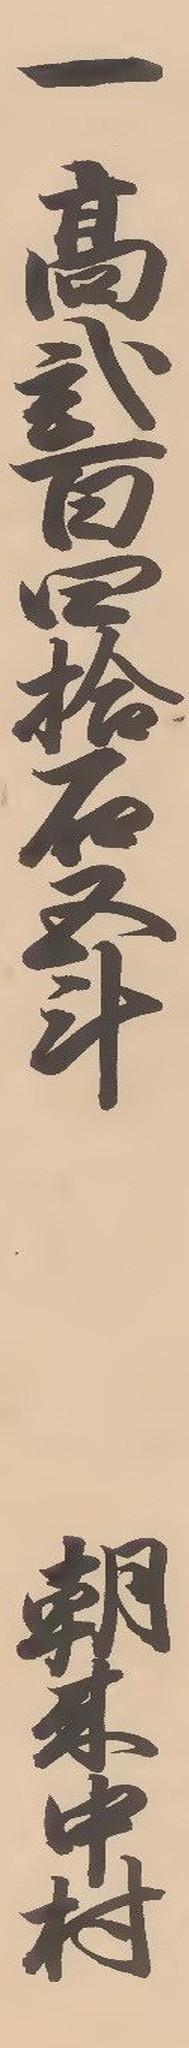一高弐百四拾石五斗朝来中村
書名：丹後国郷帳
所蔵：国立公文書館 National Archives of Japan
